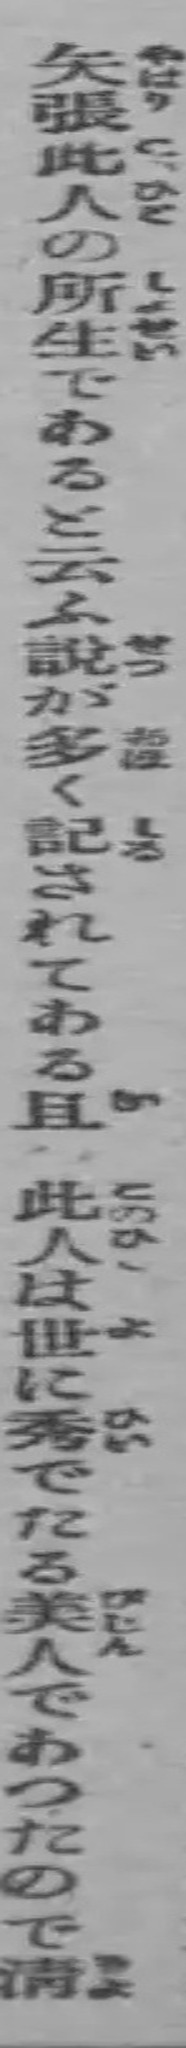矢張此人の所生であると云ふ説が多く記されてある且つ此人は世に秀でたる美人であつたので清
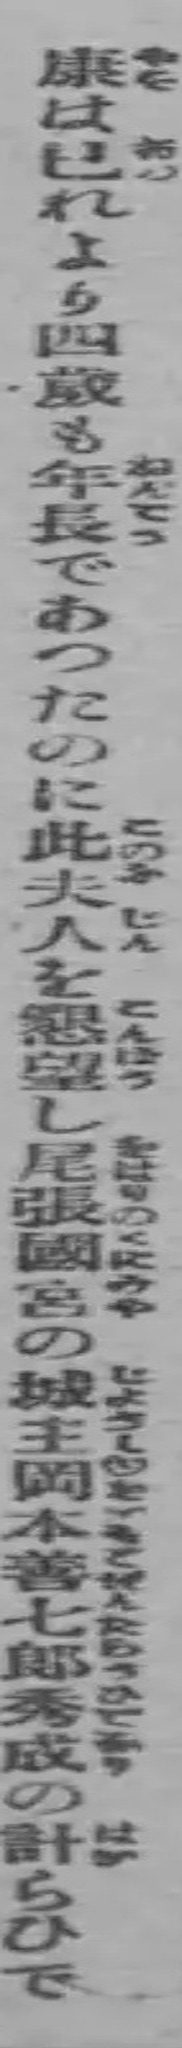康は巳れより四歳も年長であつたのに此夫人を懇望し尾張国宮の城主岡本善七郎秀成の計らひで
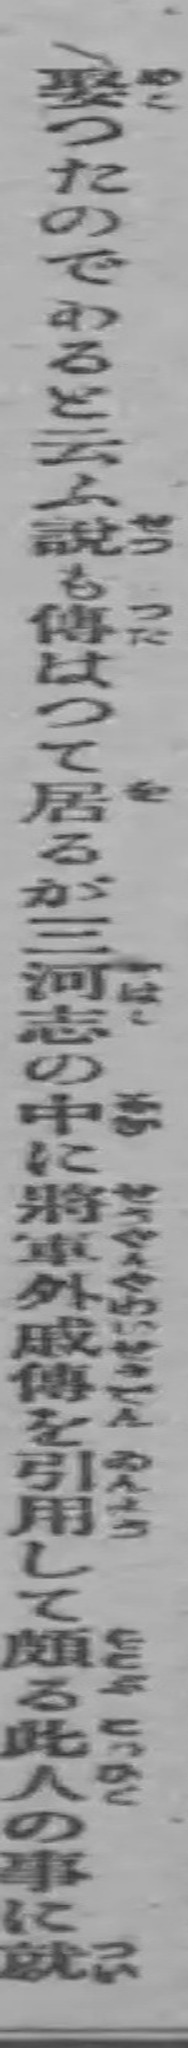娶つたのであると云ふ説も伝はつて居るが三河志の中に将軍外戚伝を引用して頗る此人の事に就
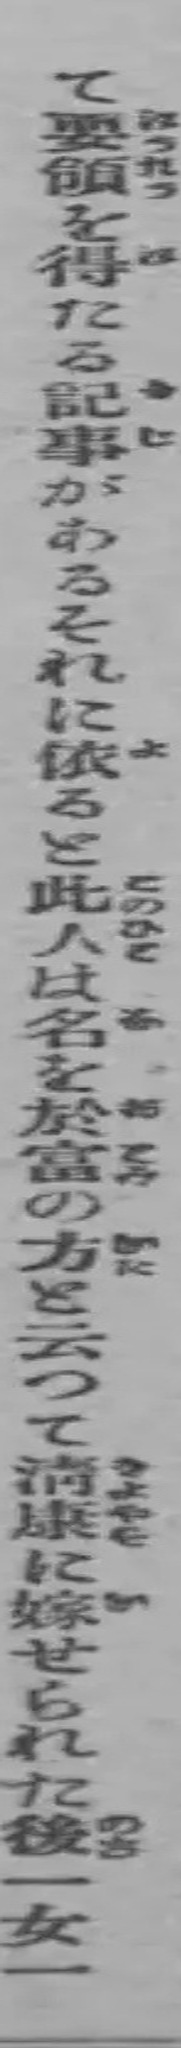て要領を得たる記事があるそれに依ると此人は名を於富の方と云つて清康に嫁せられた後一女一
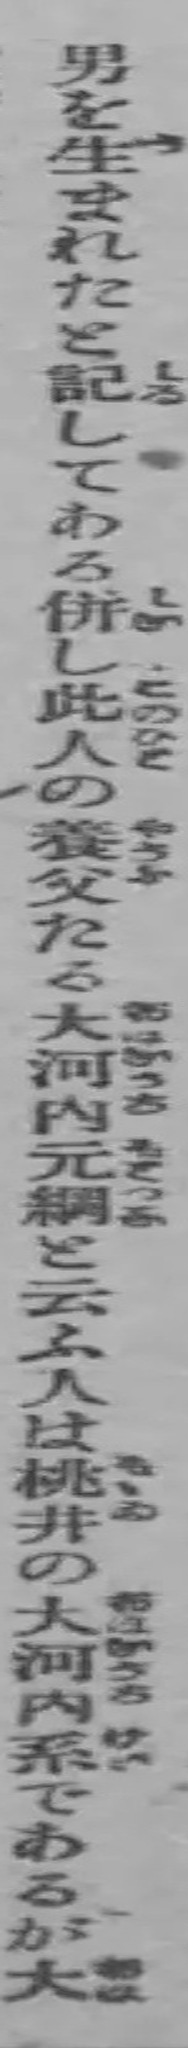男を生まれたと記してある併し此人の養父たる大河内元網と云ふ人は桃井の大河内系であるが大
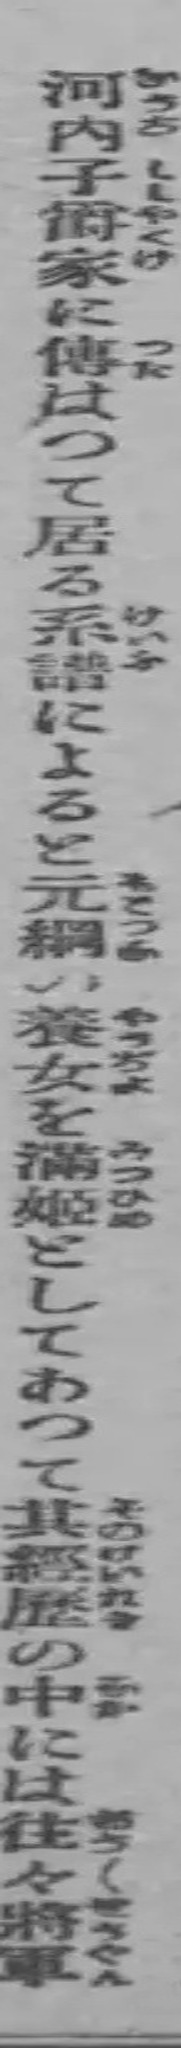河内子爵家に伝はつて居る系譜によると元網の養女を満姫としてあつて其経歴の中には往々将軍
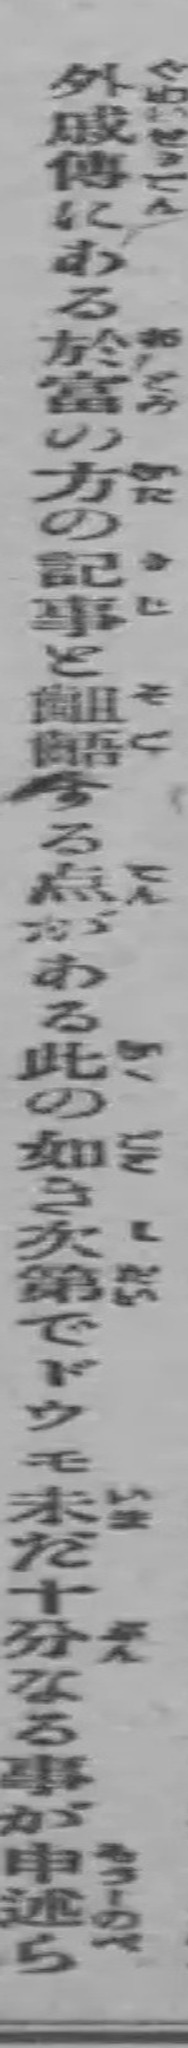外戚伝にある於富の方の記事と齟齬する点がある此の如き次第でドウモ未だ十分なる事が申述ら
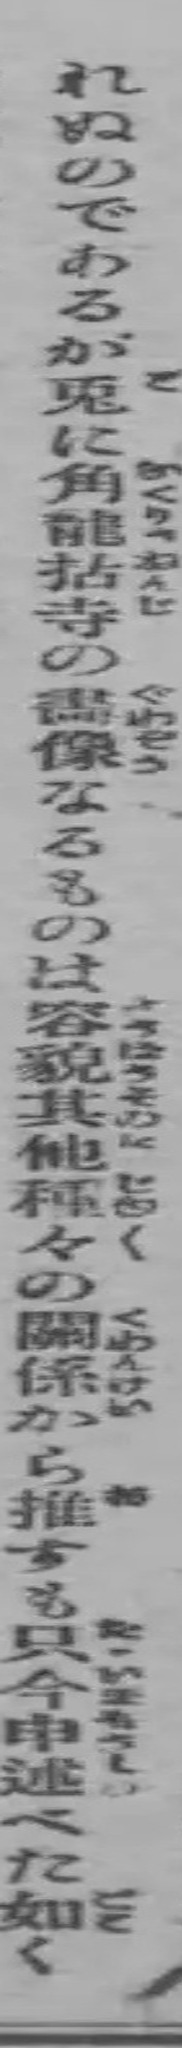れぬのであるが兎に角龍拈寺の画像なるものは容貌其他種々の関係から推すも只今申述べた如く
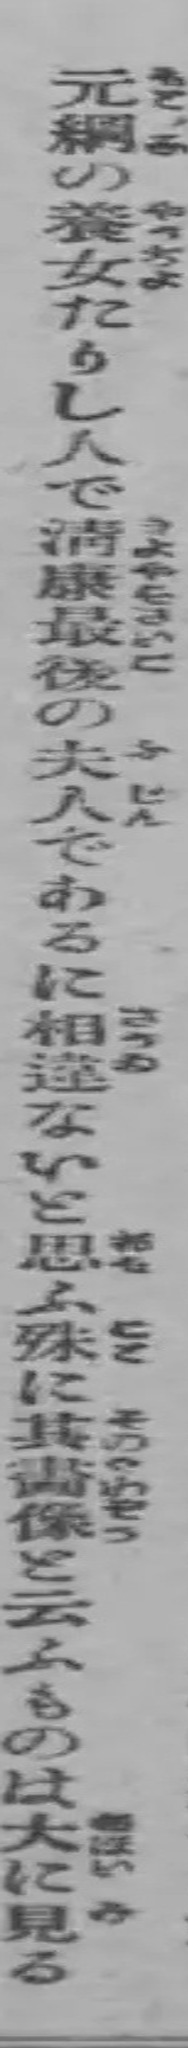元網の養女たりし人で清康最後の夫人であるに相違ないと思ふ殊に其画像と云ふものは大に見る
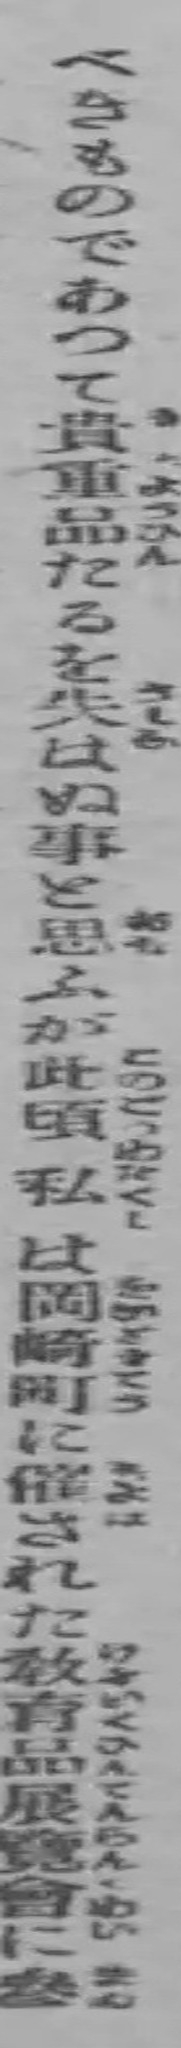べきものであつて貴重品たるを失はぬ事と思ふが此頃私は岡崎町に催された教育品展覧会に参
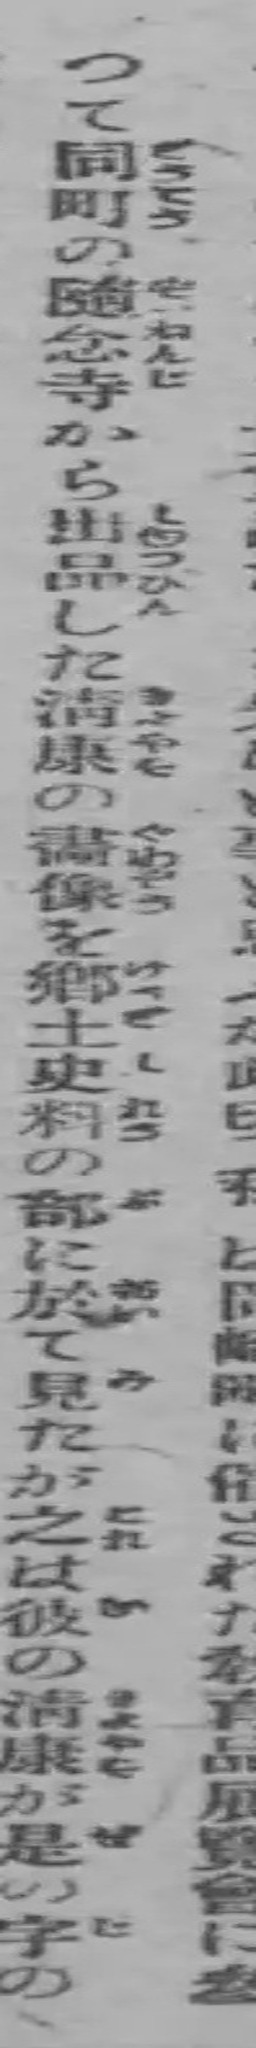つて同町の隨念寺から出品した清康の画像を郷土史料の部に於て見たが之は彼の清康が是の字の
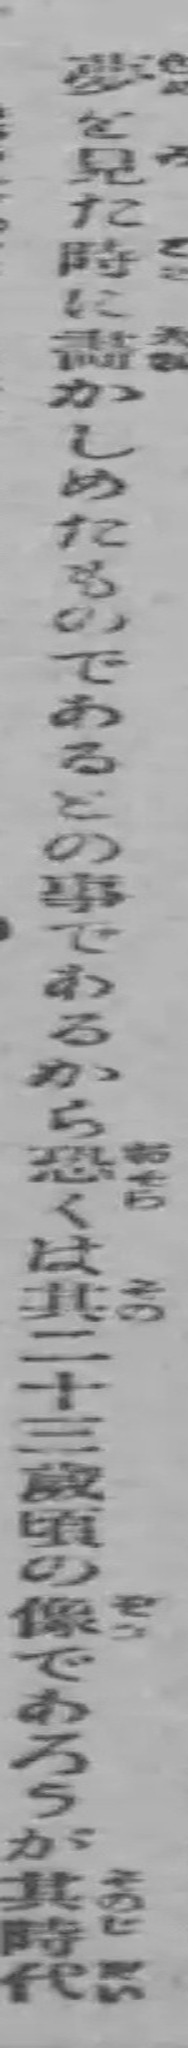夢を見た時に画かしめたものであるとの事であるから恐くは其二十三歳頃の像であろうが其時代
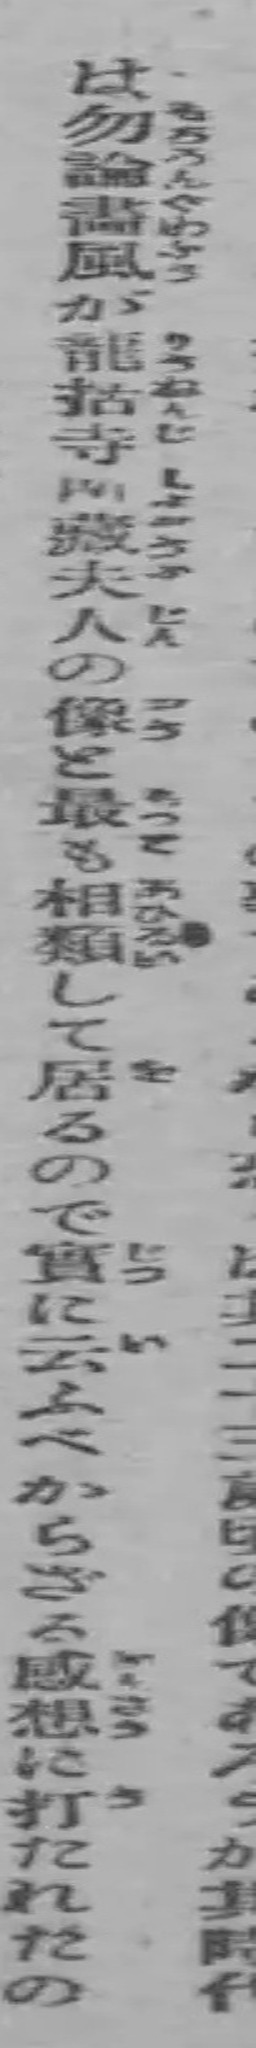は勿論画風が龍拈寺所蔵夫人の像と最も相類して居るので実に云ふべからざる感想に打たれたの
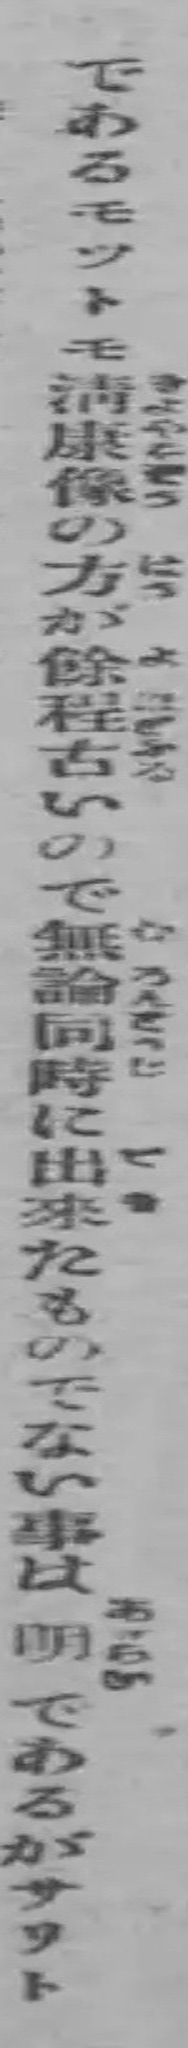であるモツトモ清康像の方が余程古いので無論同時に出来たものでない事は明であるがサリト
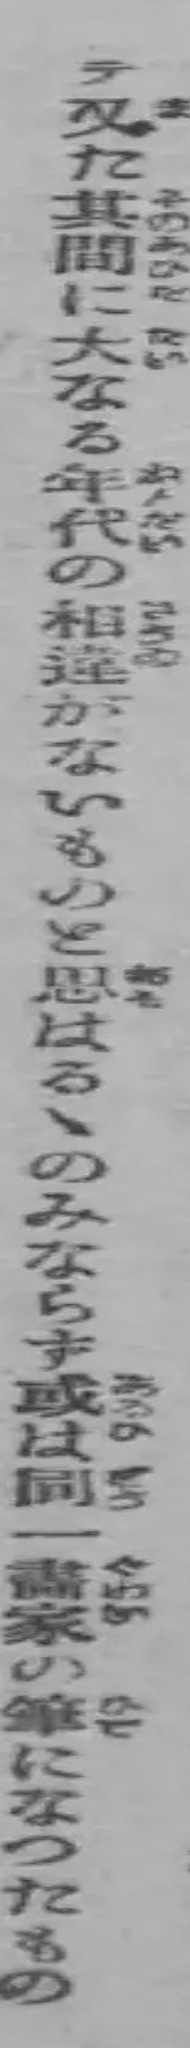テ又た其間に大なる年代の相違がないものと思はるゝのみならず或は同一画家の筆になつたもの
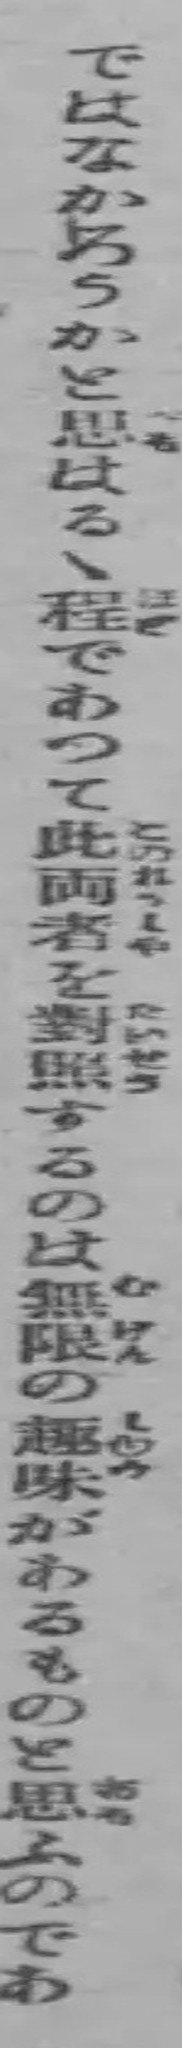ではなかろうかと思はるゝ程であつて此両者を対照するのは無限の趣味があるものと思ふのであ
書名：豊橋市史談
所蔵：国立国会図書館 National Diet Library, JAPAN
